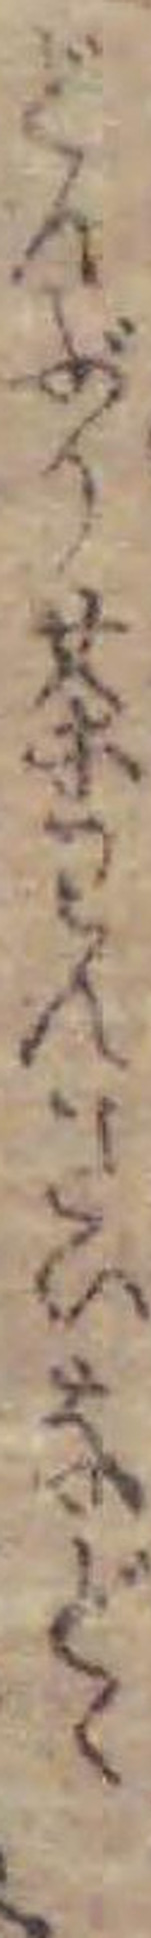どんぶり茶わんさいなどゝ
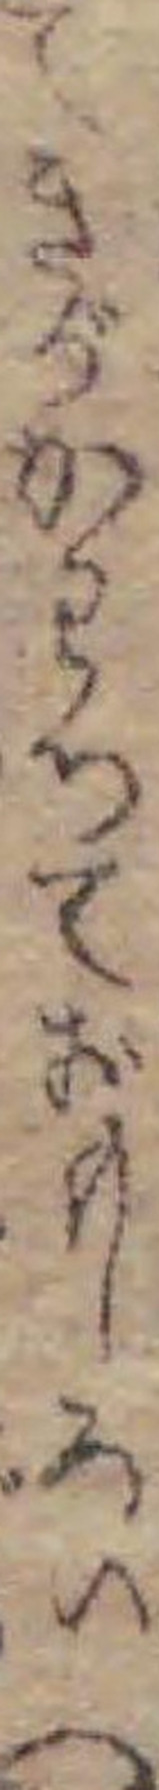てきがかわつておもしろい
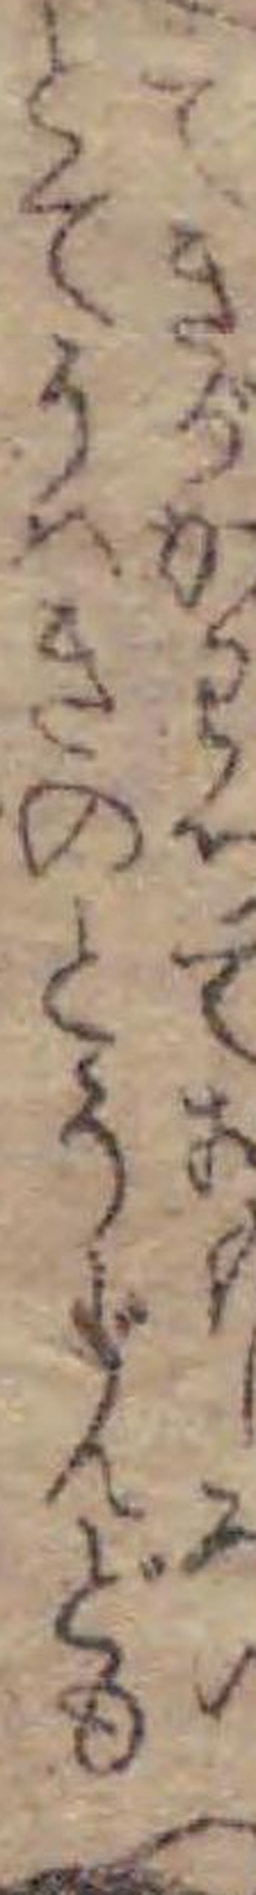とてうはきのとうじんども
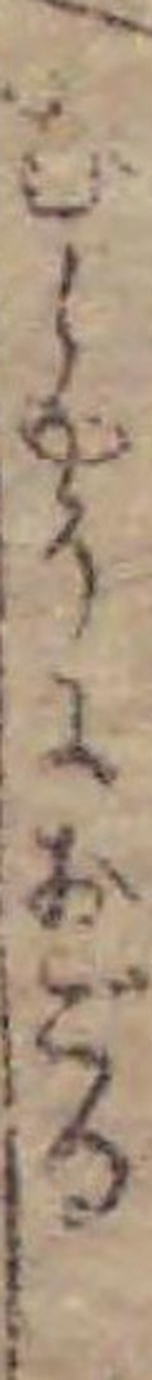むしやうにおごる
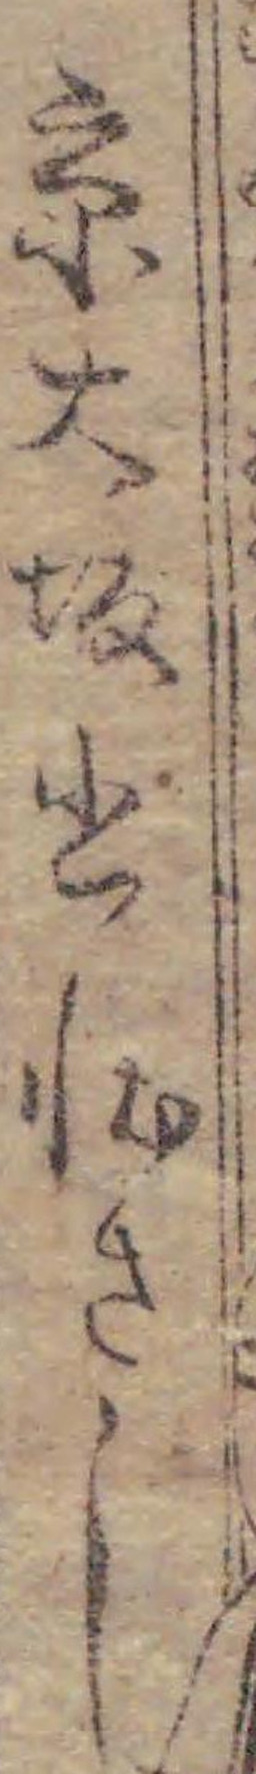京大坂書状さし
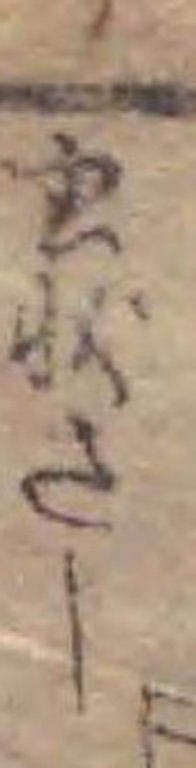書状さし
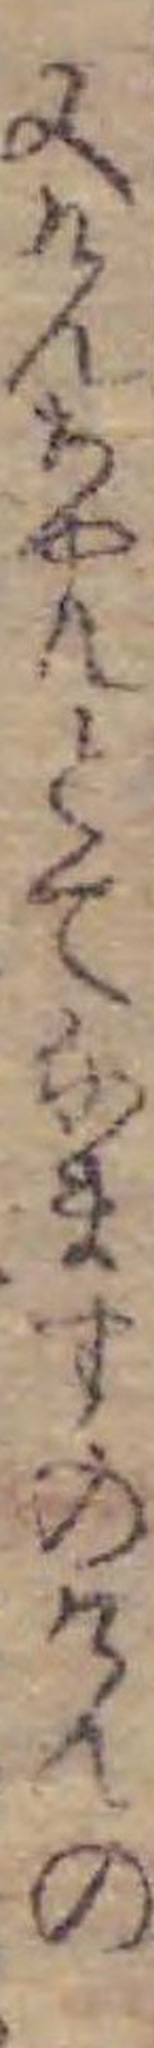又けんちやんとてなますのけんの
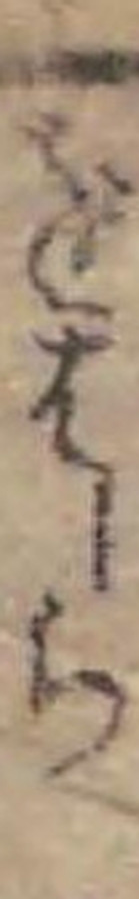をはしら
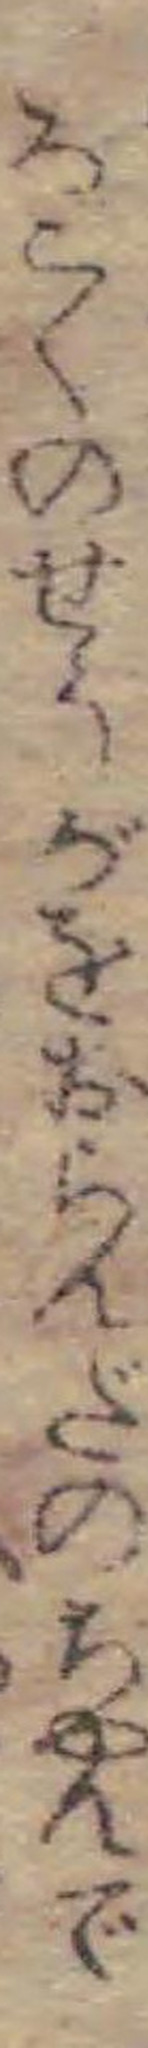ろこくのせうがをおらんだのちやんで
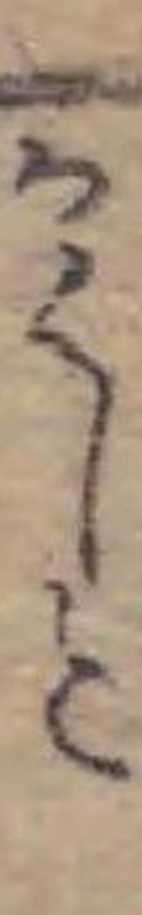かくしと
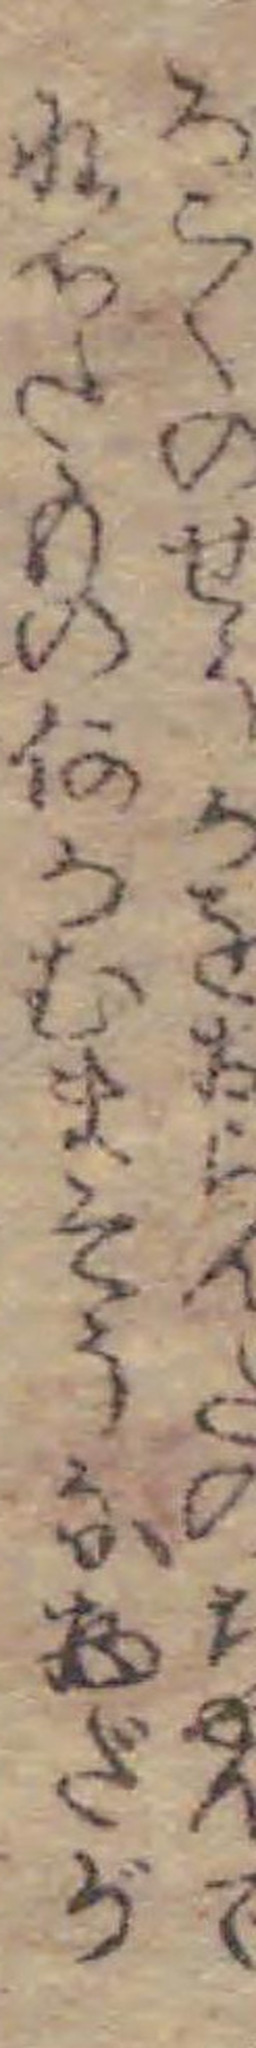ねつたもの何かむまそうな物だが
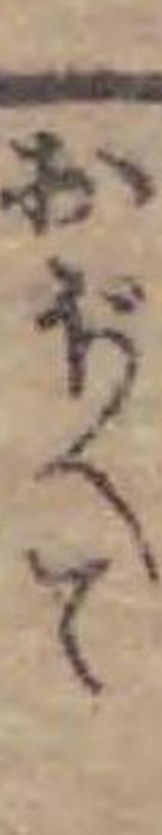おぼへて
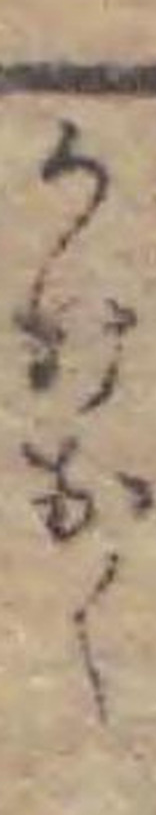かけおく
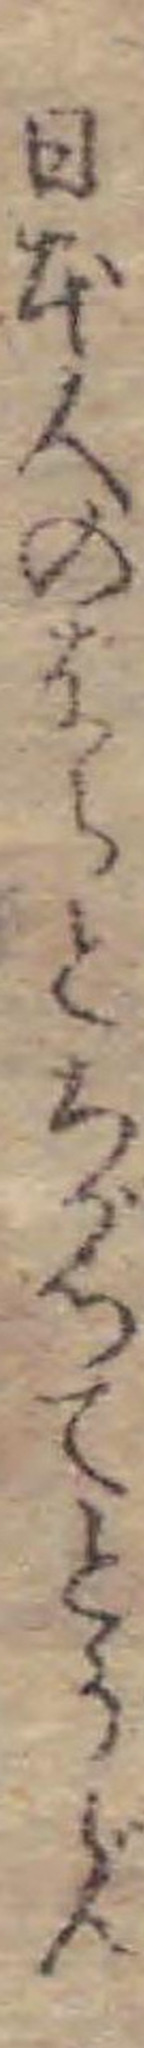日本人のはらとちがつてとうじん
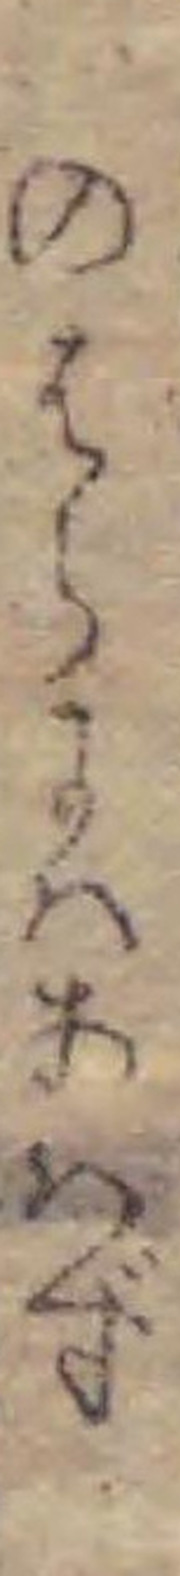のはらにはあはず
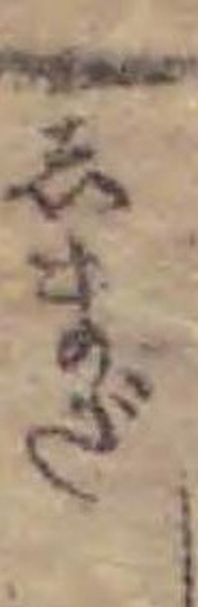しまだ
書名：此奴和日本 : 2巻
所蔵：国立国会図書館 National Diet Library, JAPAN
